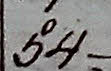54
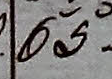65
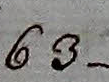63
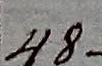48
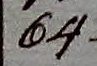64
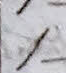1
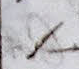1
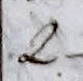2
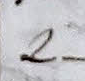2
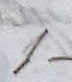1
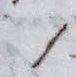1
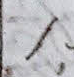1
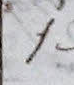1
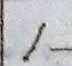1
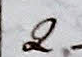2
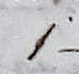1
